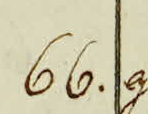66.
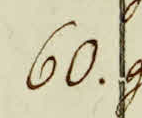60.
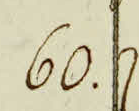60.
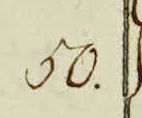50.
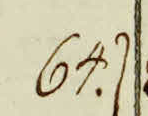64.
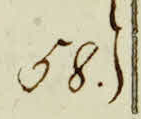58.
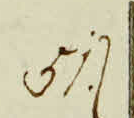51.
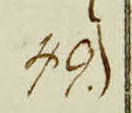49.
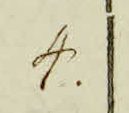4.
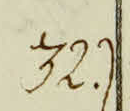32.
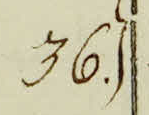36.
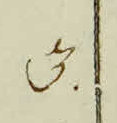3.
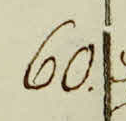60.
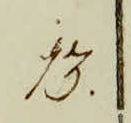13.
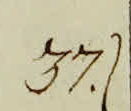37.
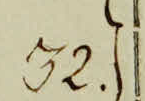32.
